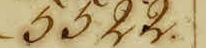5522.
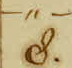8.
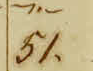51.
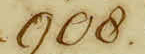908.
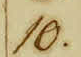10.
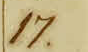17.
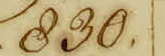830.
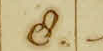8.
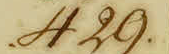429.
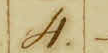4.
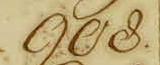908.
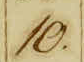10.
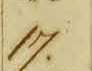17.
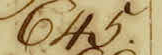645.
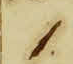1.
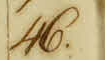46.
